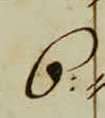6:
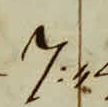7:
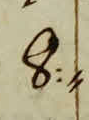8:
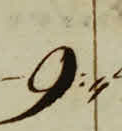9:
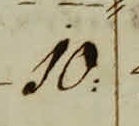10:
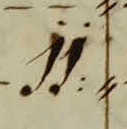11:
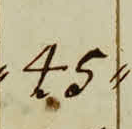45
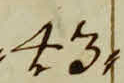43
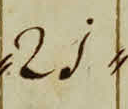21
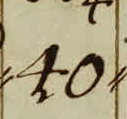40
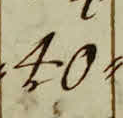40
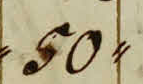50
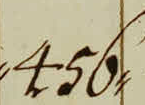456
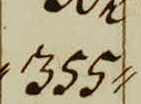355
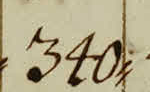340
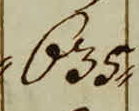635
